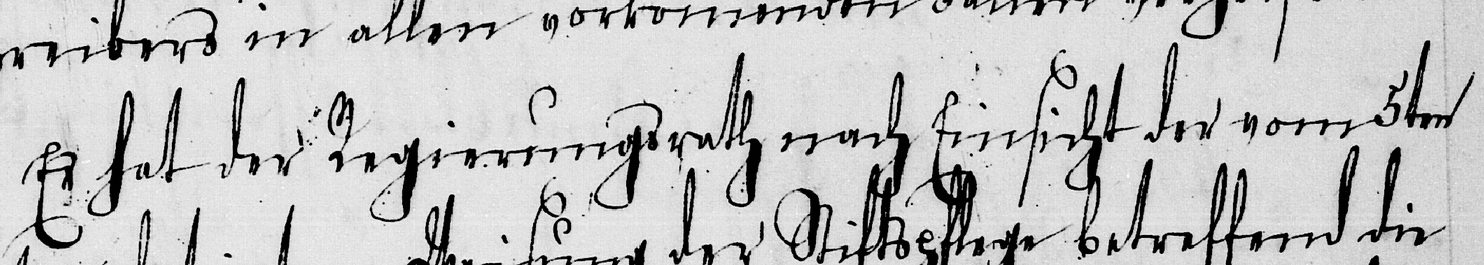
Es hat der Regierungsrath nach Einsicht der vom 5ten
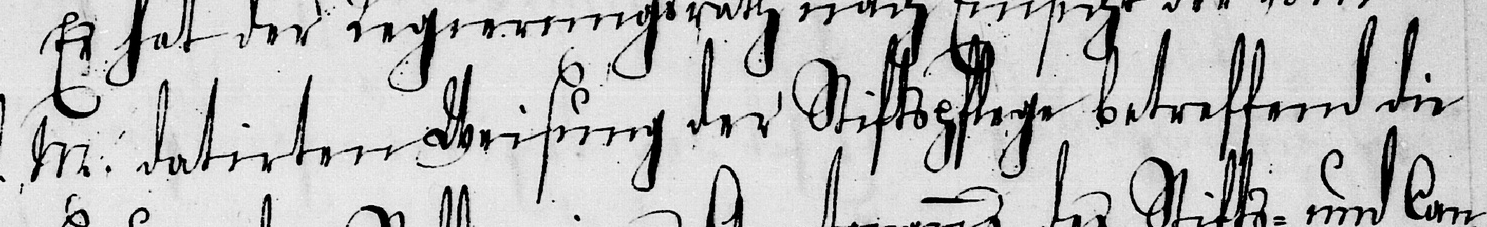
M. datirten Weisung der Stiftspflege betreffend die
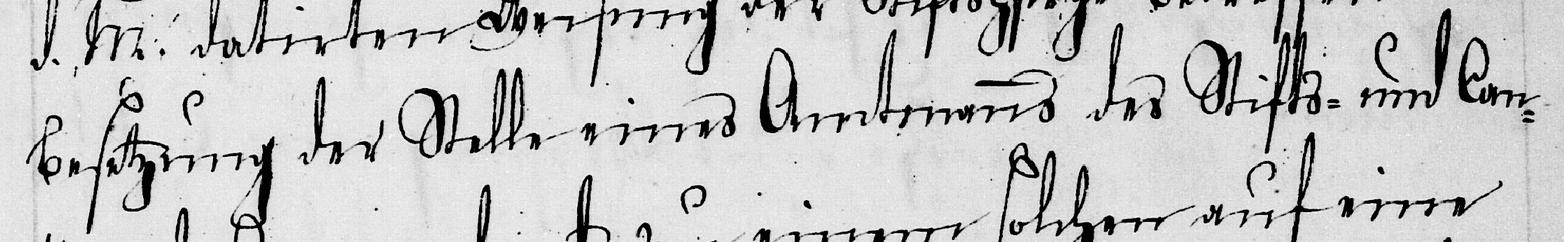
Besetzung der Stelle eines Amtmanns des Stifts- und Can¬
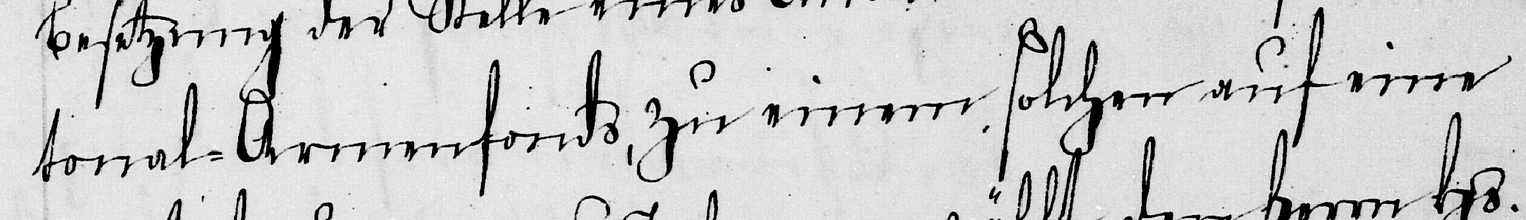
tonal-Armenfonds, zu einem solchen auf eine
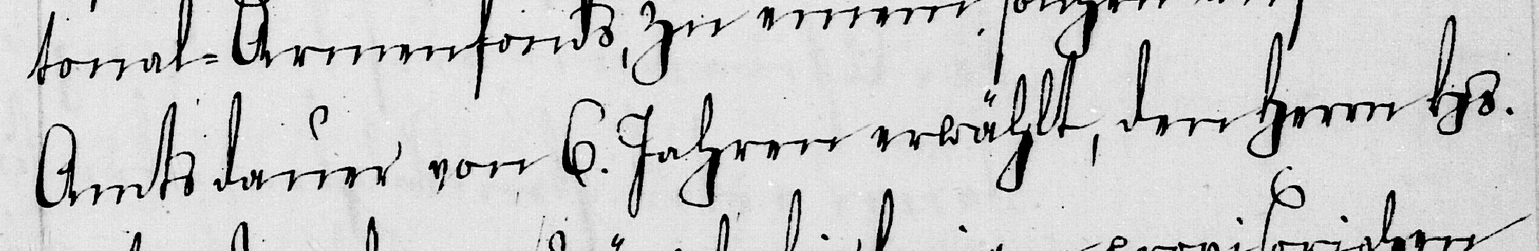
Amtsdauer von 6. Jahren erwählt, den Herrn Hs.
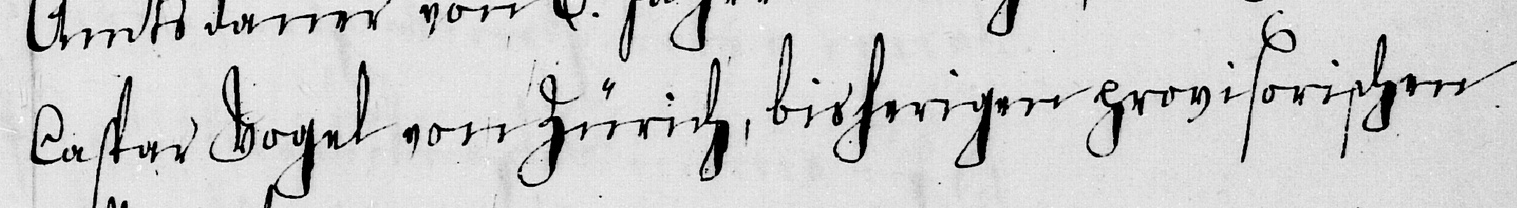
Caspar Vogel von Zürich, bisherigen provisorischen
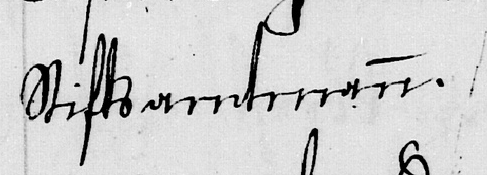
Stiftsamtmann.
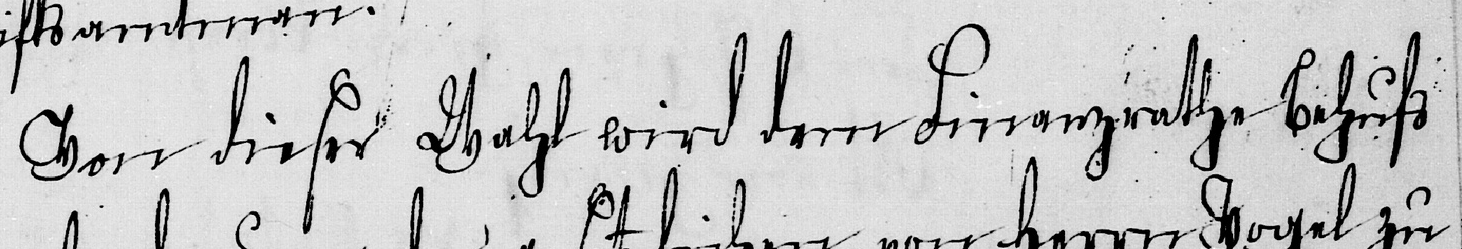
Von dieser Wahl wird dem Finanzrathe Behufs
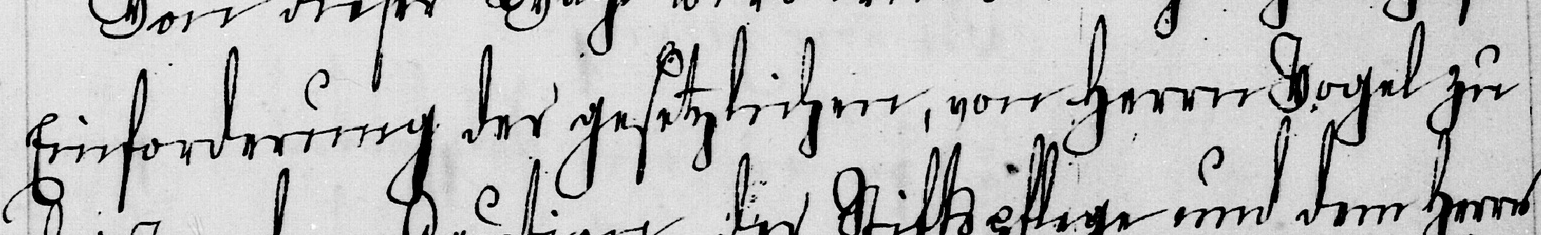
Einforderung der gesetzlichen, von Herrn Vogel zu
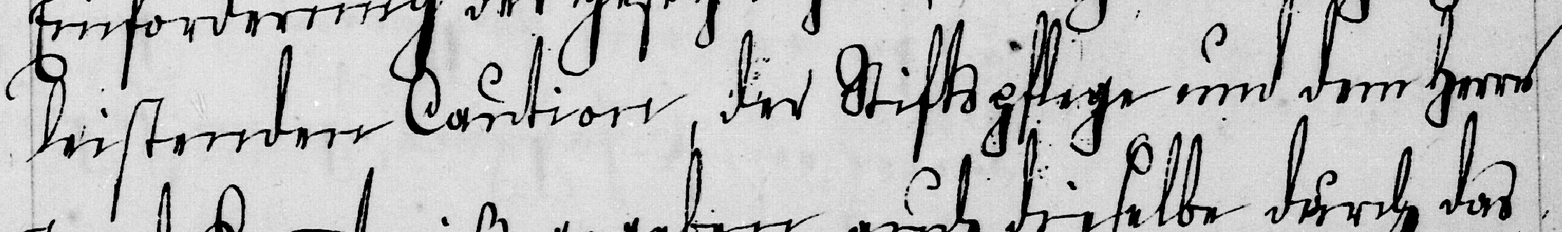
leistenden Caution, der Stiftspflege und dem Herrn
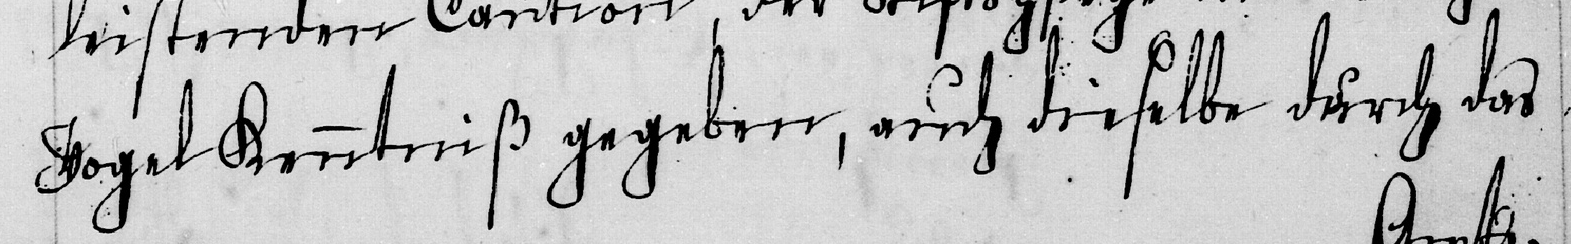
Vogel Kenntniß gegeben, auch dieselbe durch das
